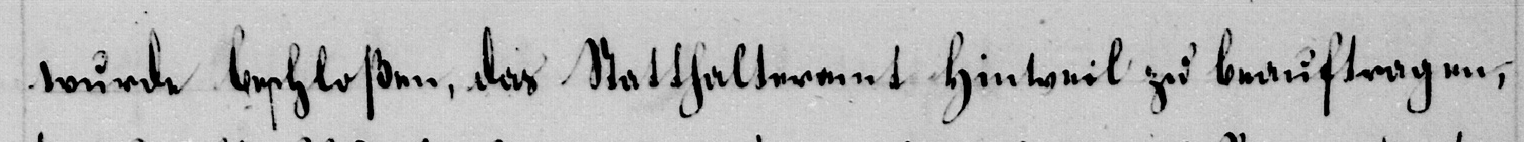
wurde beschloßen, das Statthalteramt Hinweil zu beauftragen,
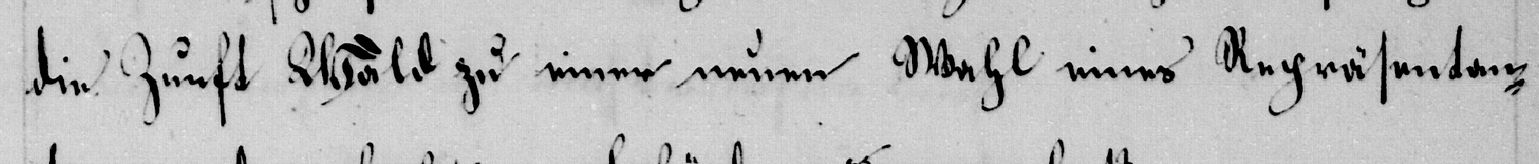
die Zunft Wald zu einer neuen Wahl eines Repräsentan¬
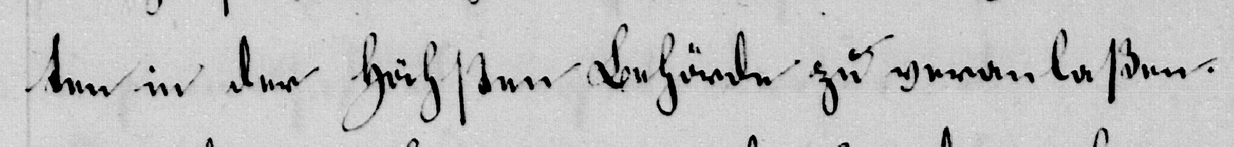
ten in der Höchsten Behörde zu veranlaßen.
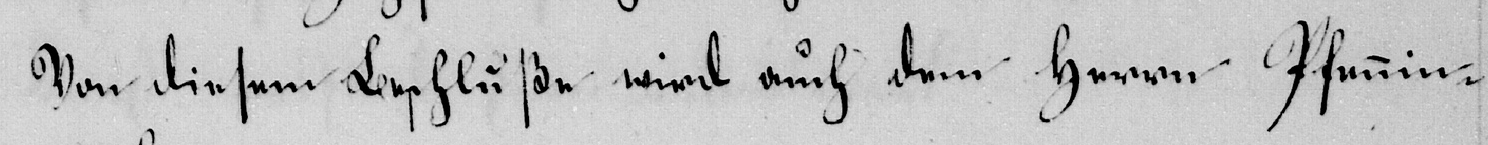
Von diesem Beschluße wird auch dem Herrn Pfennin¬
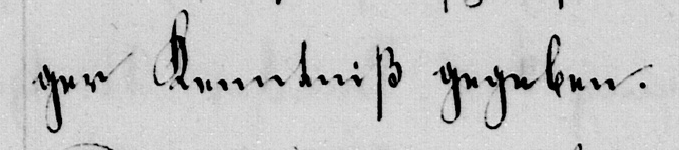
ger Kenntniß gegeben.
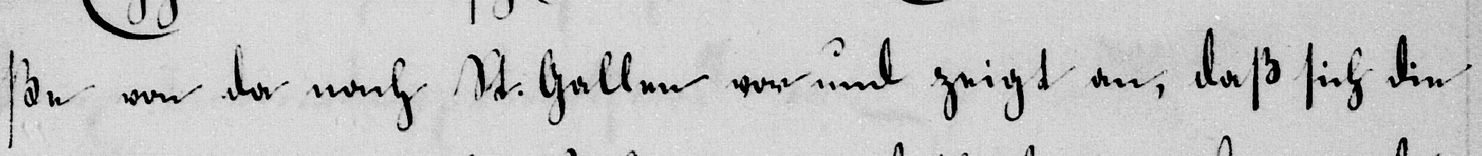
e von da nach St. Gallen vor und zeigt an, daß sich die
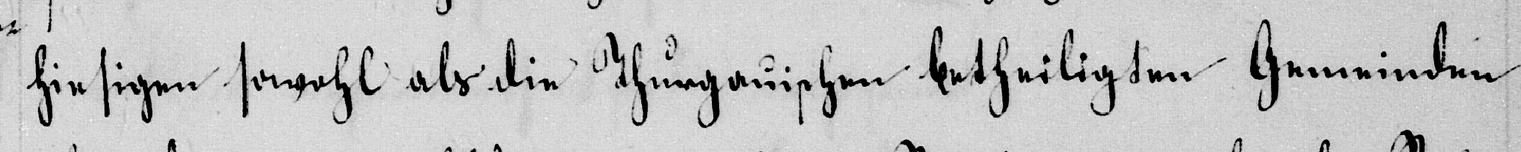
hiesigen sowohl als die Thurgauischen betheiligten Gemeinden
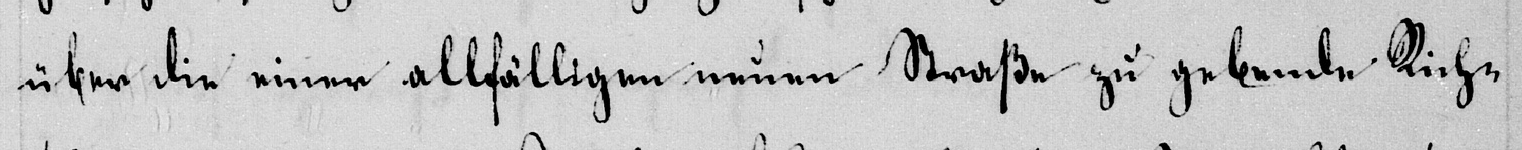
über die einer allfälligen neuen Straße zu gebende Rich¬
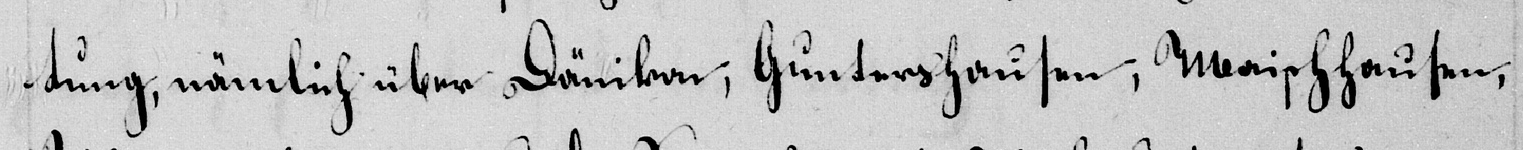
tung, nämlich über Dänikon, Guntershausen, Maischhausen,
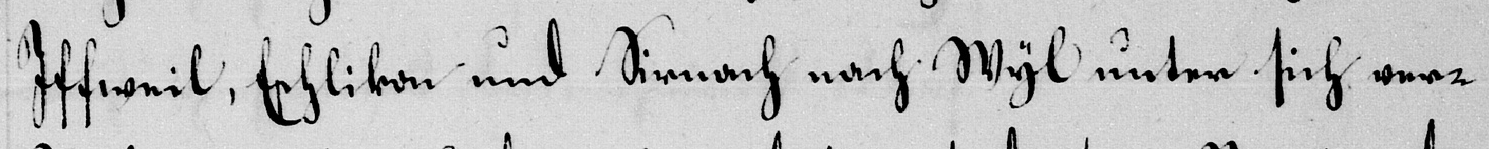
Iffweil, Eschlikon und Sirnach nach Wyl unter sich ver¬
